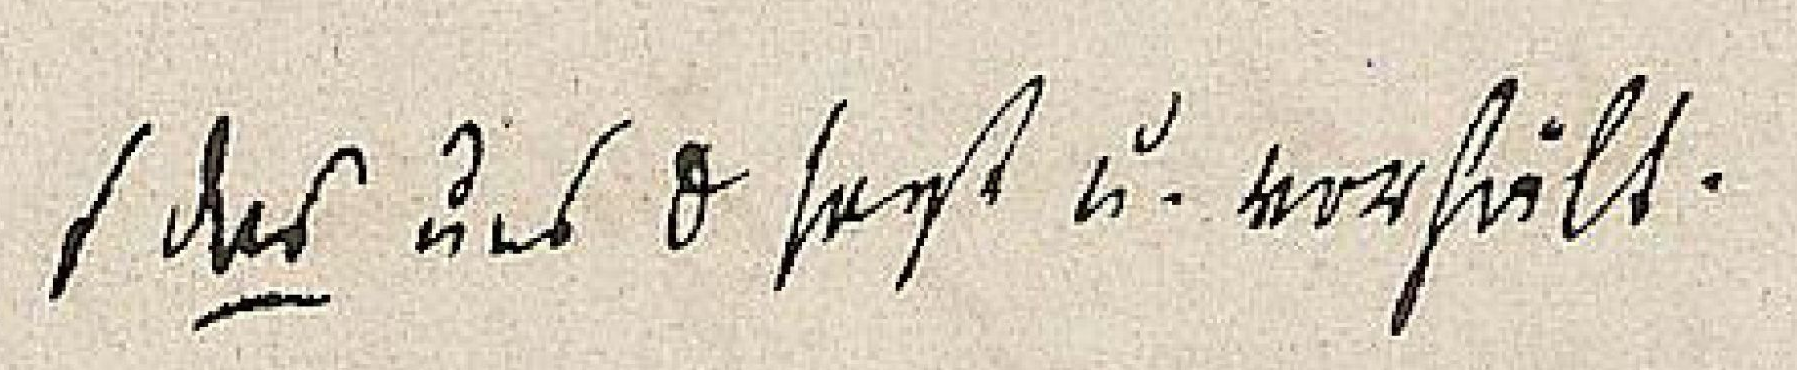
V das uns o sagt u. vorhält.
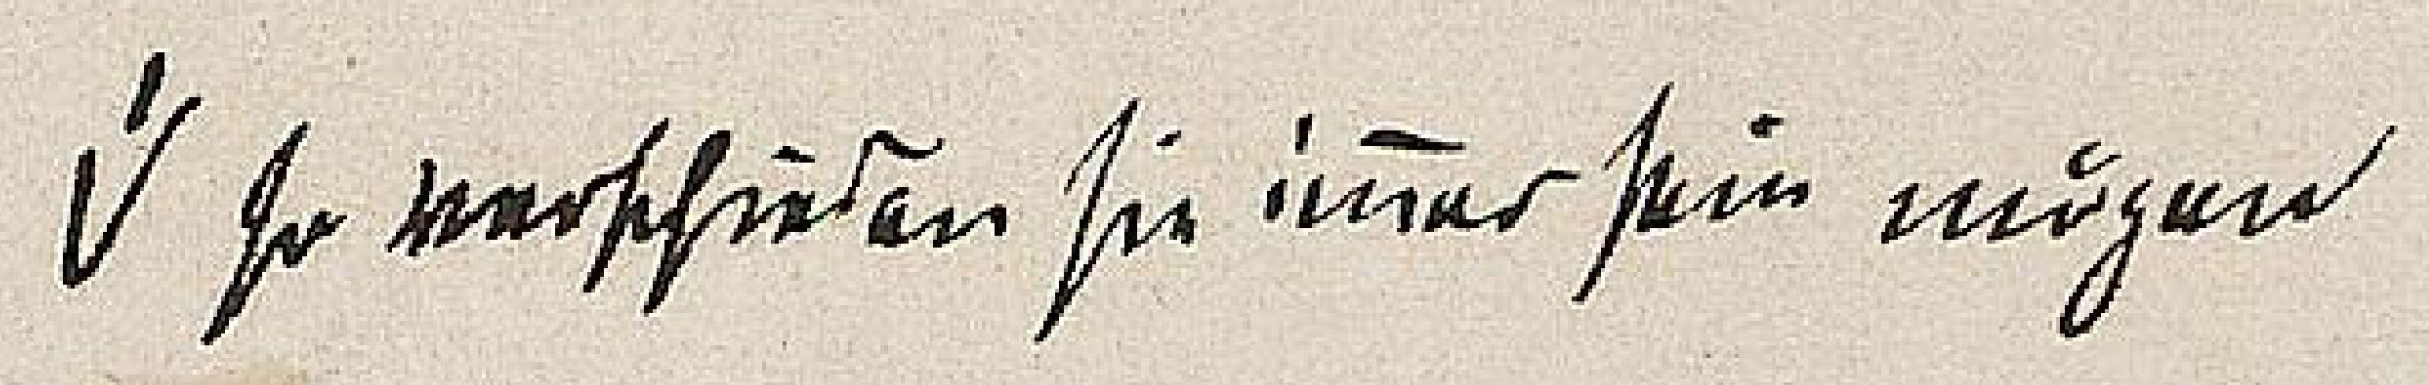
V so verschieden sie immer sein mögen
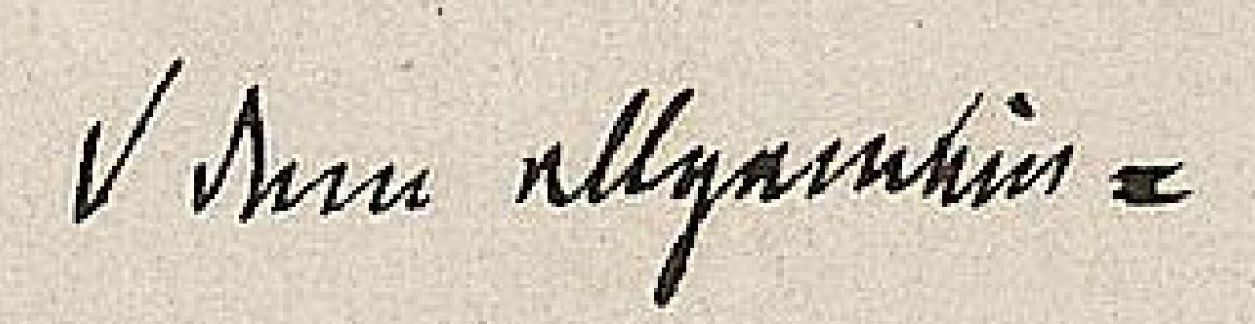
V dem allgemein¬
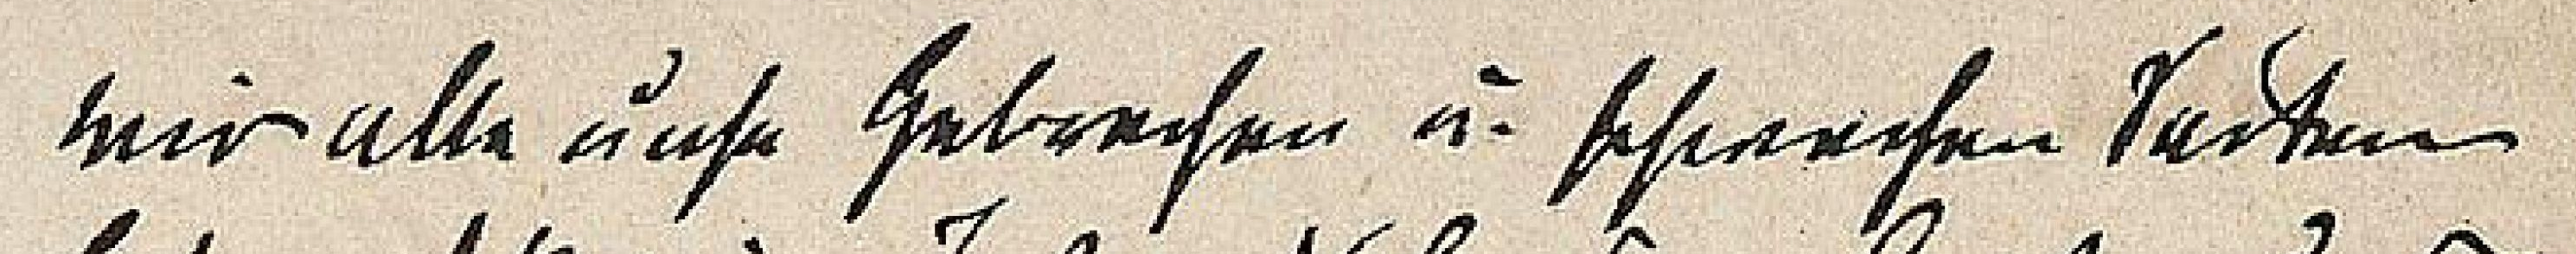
wir alle unse Gebrechen u. schwachen Seiten
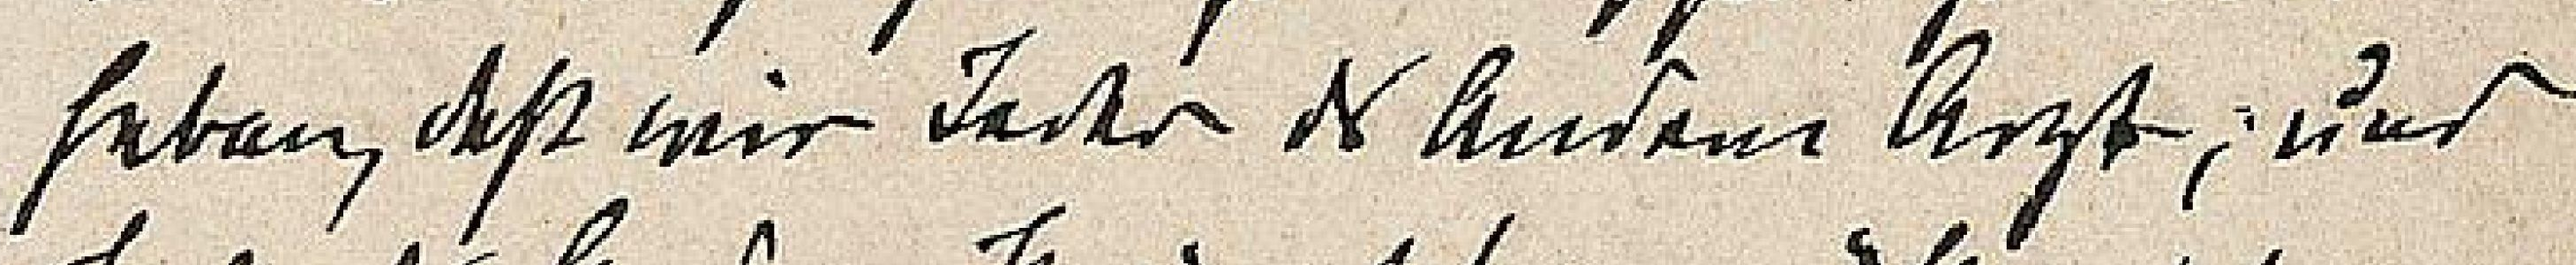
haben, daß wir Jeder das Andern Arzt; und
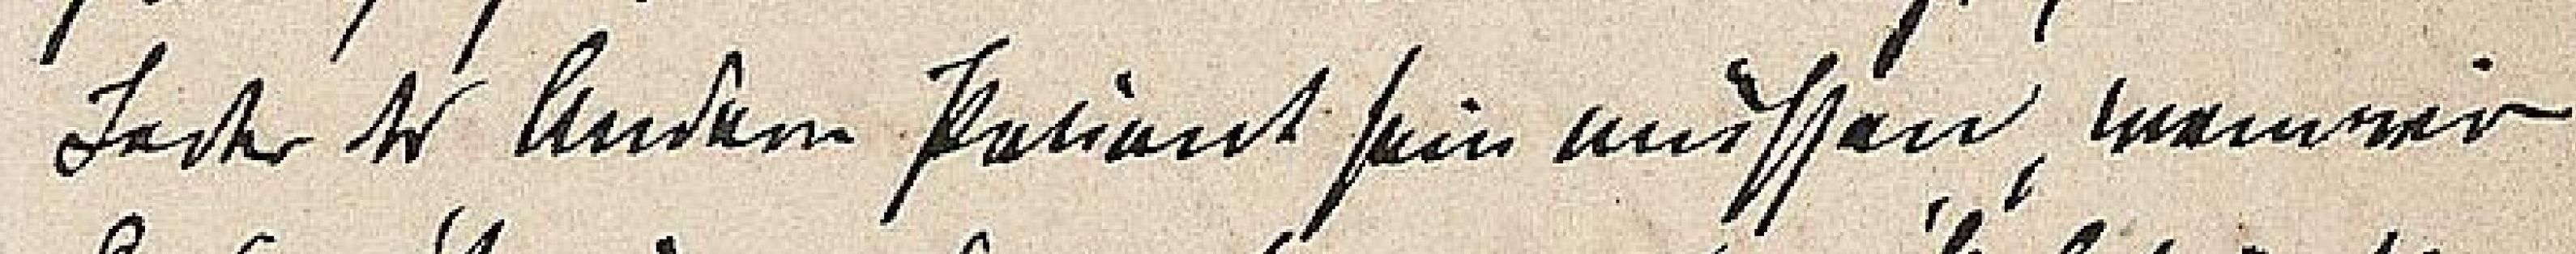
Jeder das Andern Patient sein müssen, wenn wir
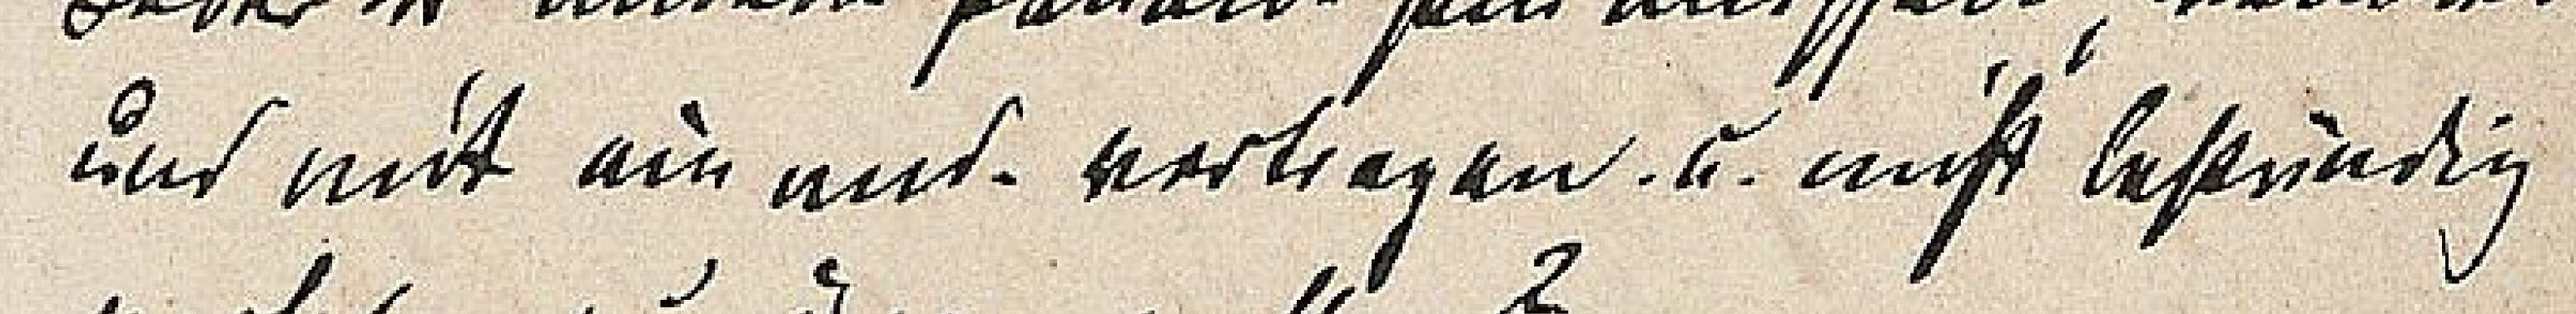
und mit einand. vertragen u. nicht beständig
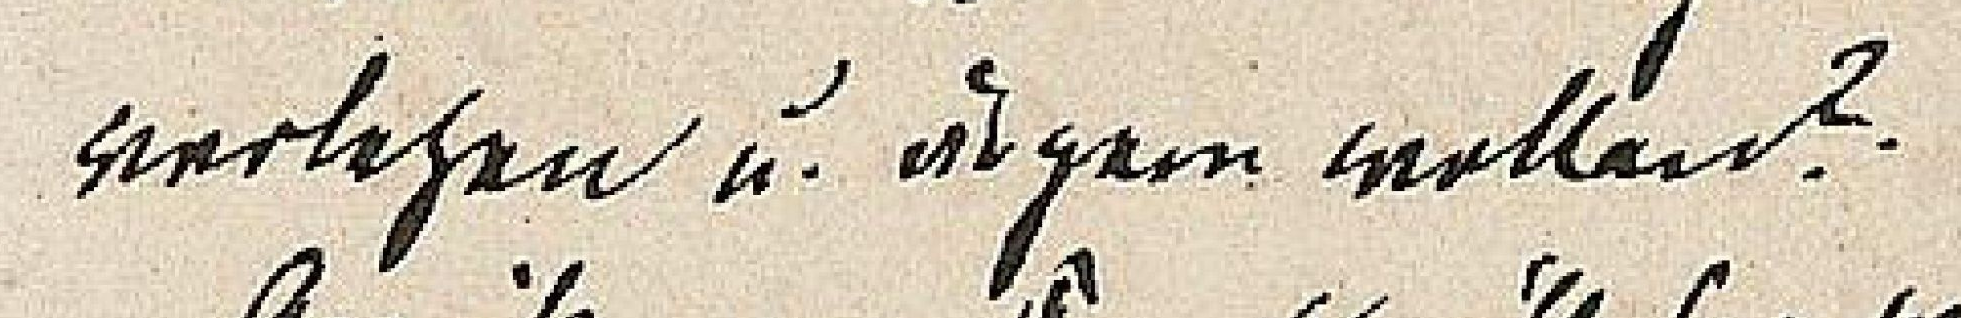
verletzten u. ärgeren wollen?
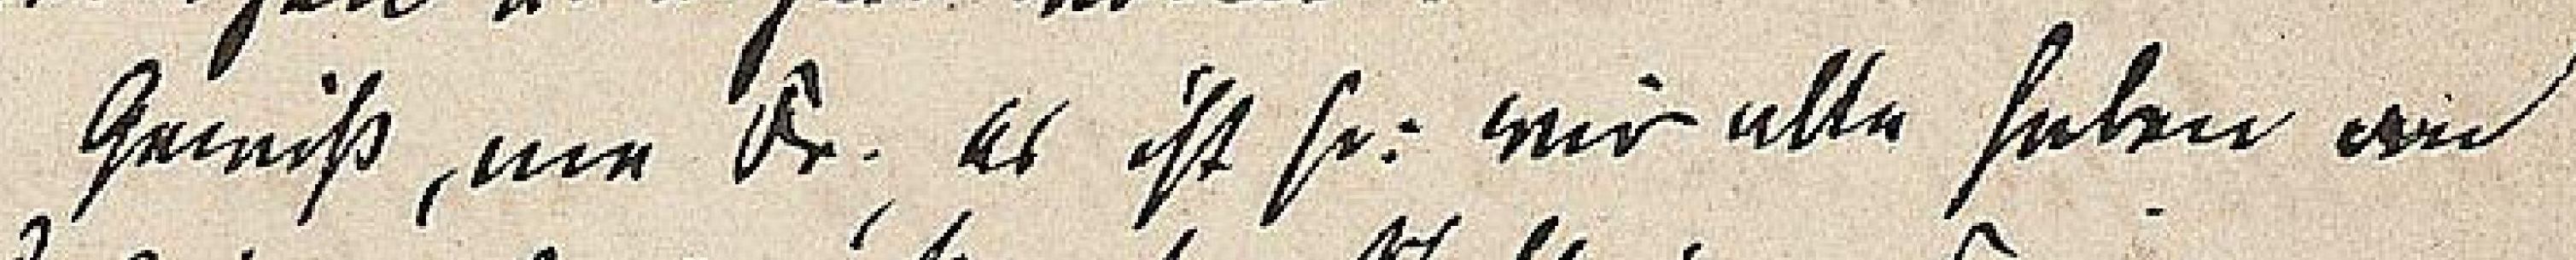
Gewiß, mn Fr., es ist so: wir alle haben an
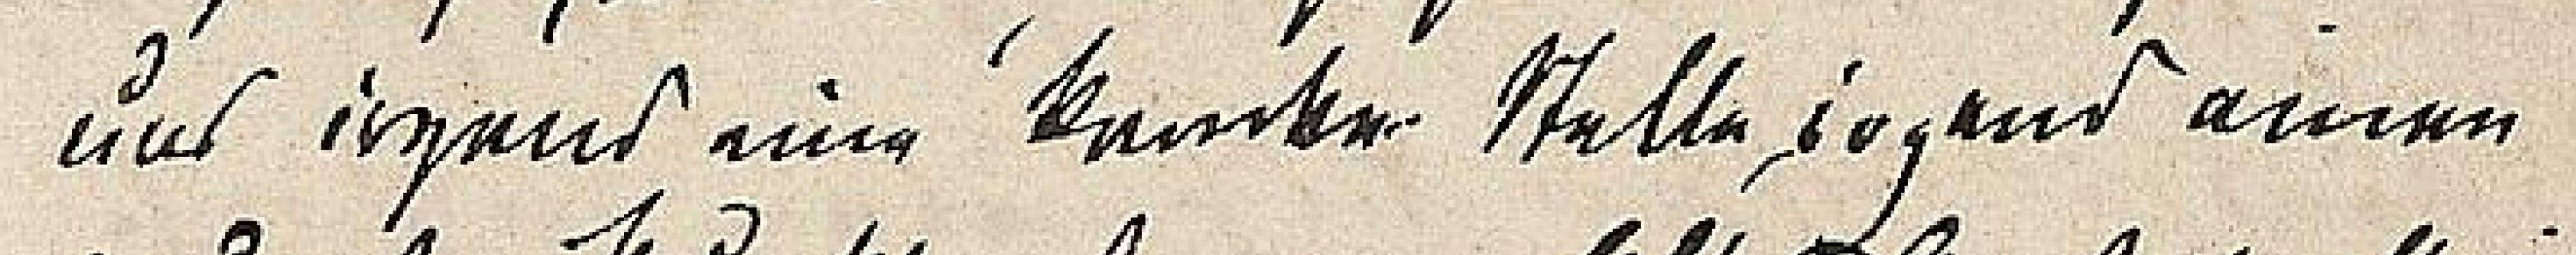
uns irgend eine kanke Stelle irgend einen
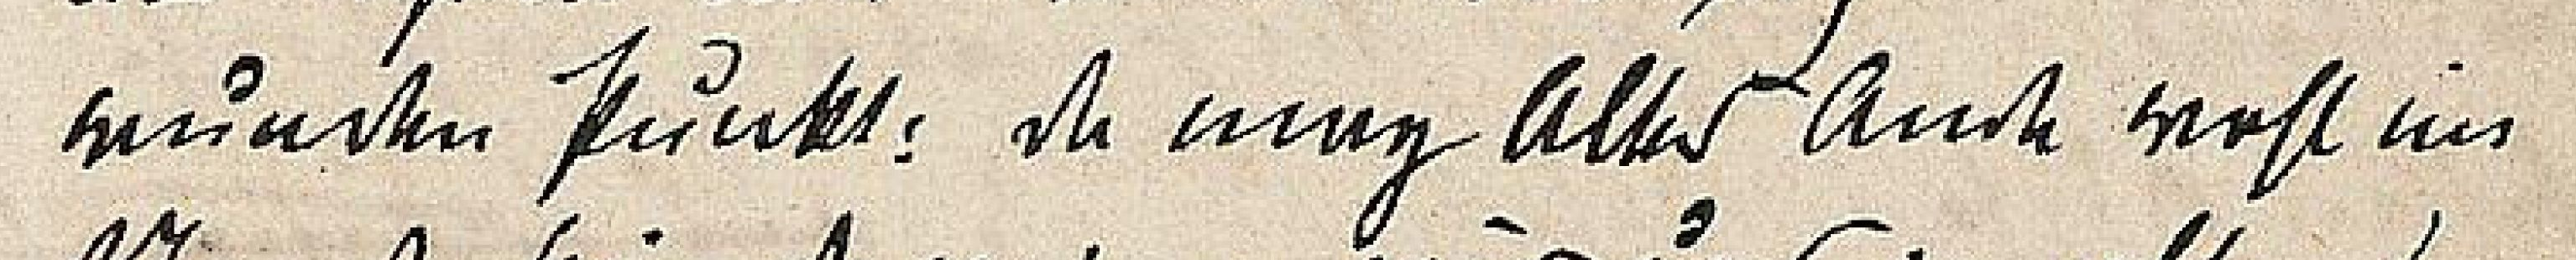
wunden Punkt: da mag Alles Ande wohl im
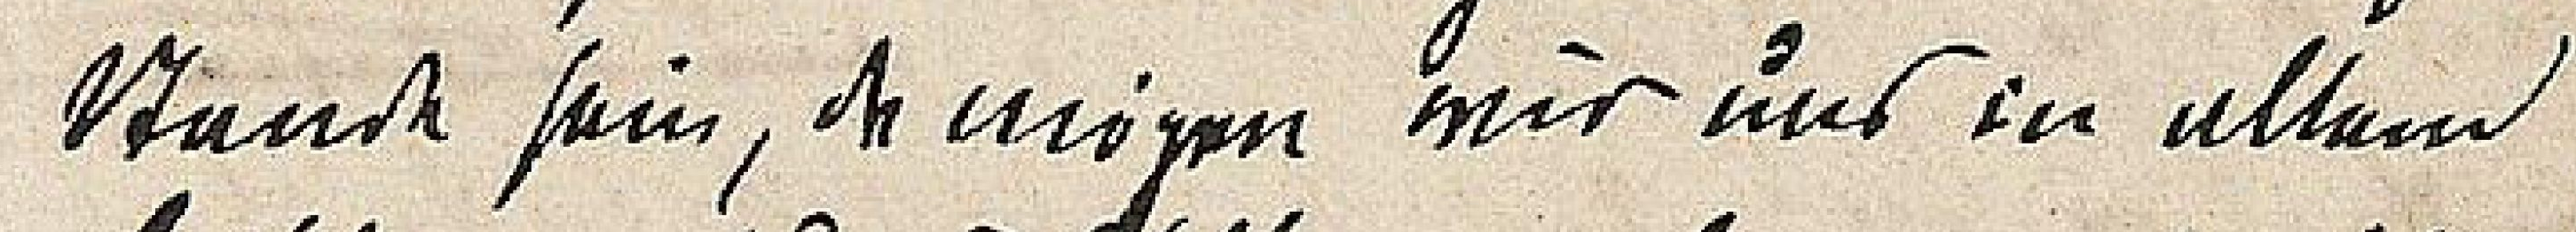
Stande sein, da mögen wir uns in allem
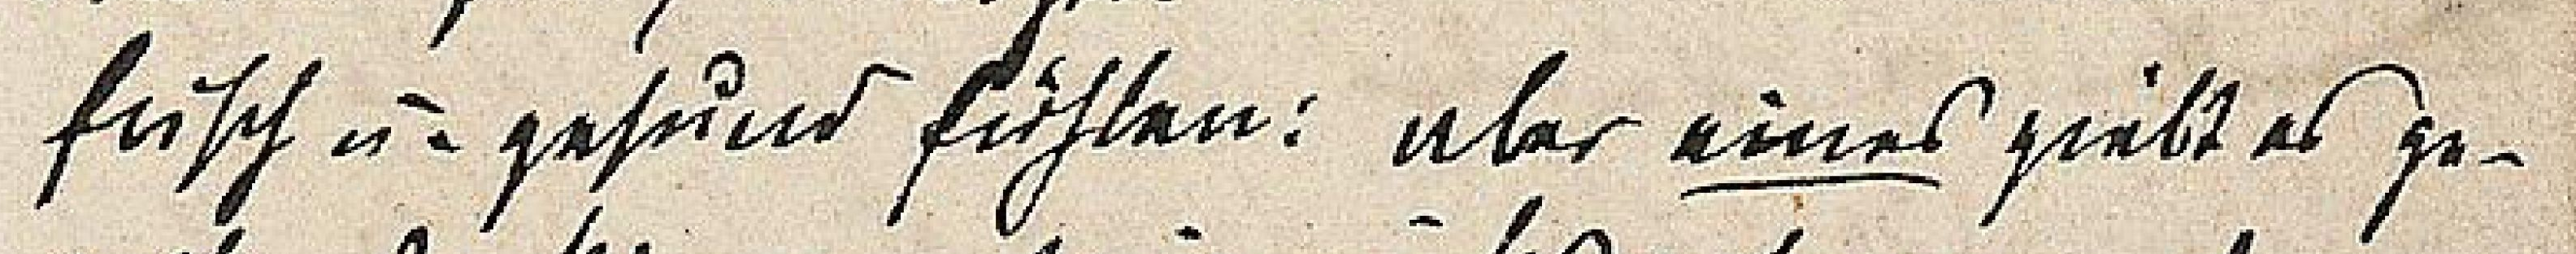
frisch u. gesund fühlen: aber eines giebt es ge¬
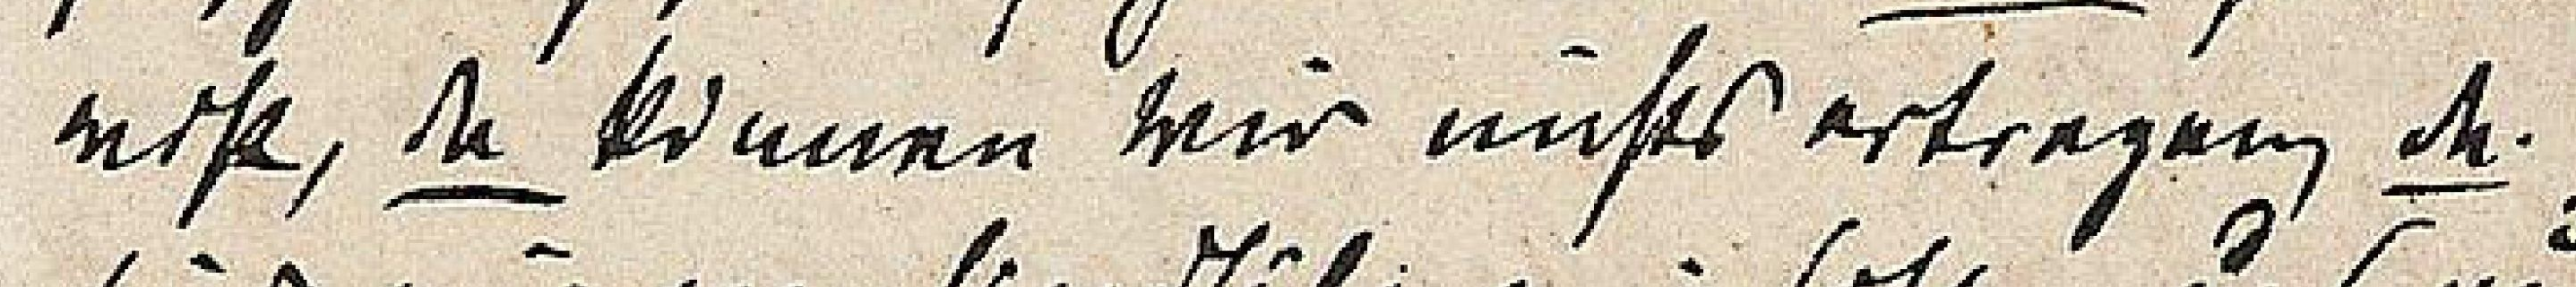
wiß, da können wir nichts ertragen, da
